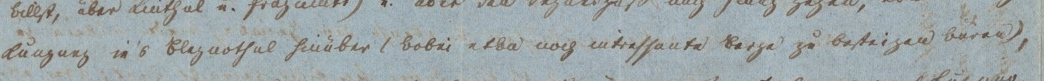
Lungnez in's Blegnothal hinüber (wobei etwa noch intressante Berge zu besteigen wären),
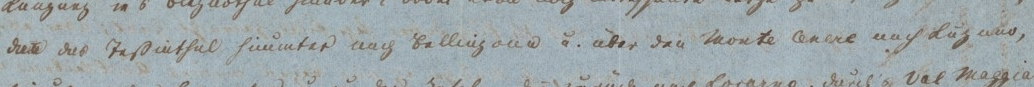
dann das Tessinthal hinunter nach Bellinzona u. über den Monte Cenere nach Lugano,
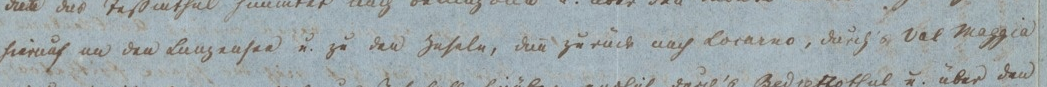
hierauf an den Langensee u. zu den Inseln, dann zurück nach Locarno, durch's Val Maggia
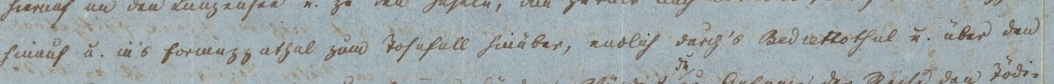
hinauf u. in's Formazzathal zum Tosafall hinüber, endlich durch's Bedrettothal u. über den
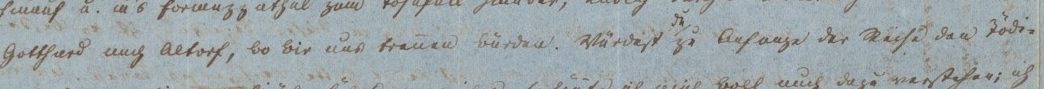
Gotthard nach Altorf, wo wir uns trennen würden. Würdest du zu Anfange der Reise den Tödi-
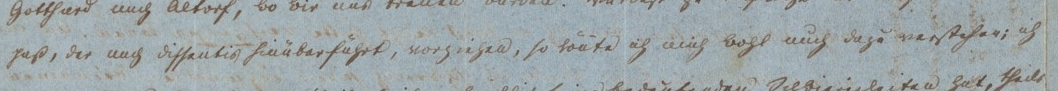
paß, der nach Dissentis hinüberführt, vorziehen, so könnte ich mich wohl auch dazu verstehen; ich
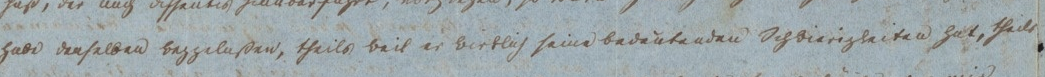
habe denselben weggelassen, theils weil er wirklich seine bedeutenden Schwierigkeiten hat, theils
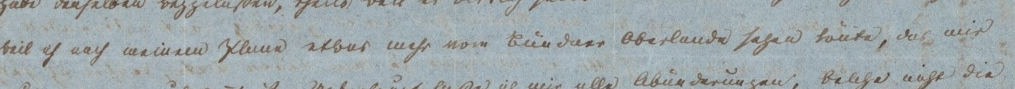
weil ich nach meinem Plane etwas mehr vom Bündner Oberlande sehen könnte, das mir
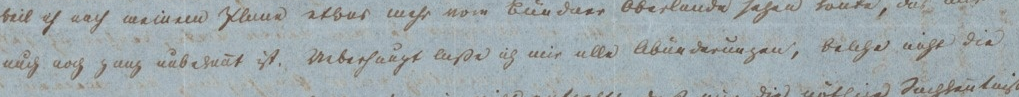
auch noch ganz unbekannt ist. Ueberhaupt lasse ich mir alle Abänderungen, welche nicht die
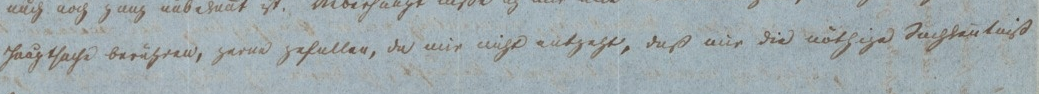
Hauptsache berühren, gerne gefallen, da mir nicht entgeht, daß mir die nöthige Sachkenntniß
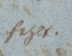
fehlt.
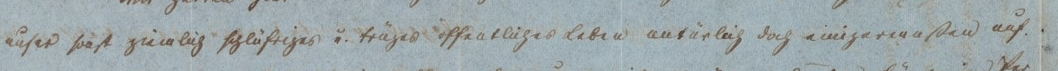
unser sonst ziemlich schläfriges u. träges öffentliches Leben natürlich doch einigermaßen auf-
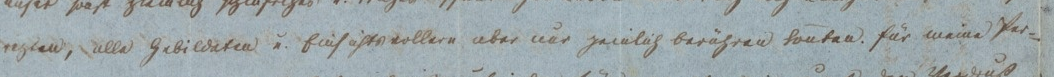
regten, alle Gebildeten u. Einsichtsvollern aber nur peinlich berühren konnten. Für meine Per-
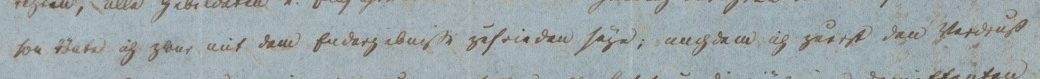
son könte ich zwar mit dem Endergebnisse zufrieden seyn; nachdem ich zuerst den Verdruß
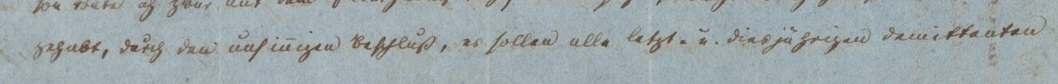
gehabt, durch den unsinnigen Beschluß, es sollen alle letzt- u. diesjährigen Demittenten
